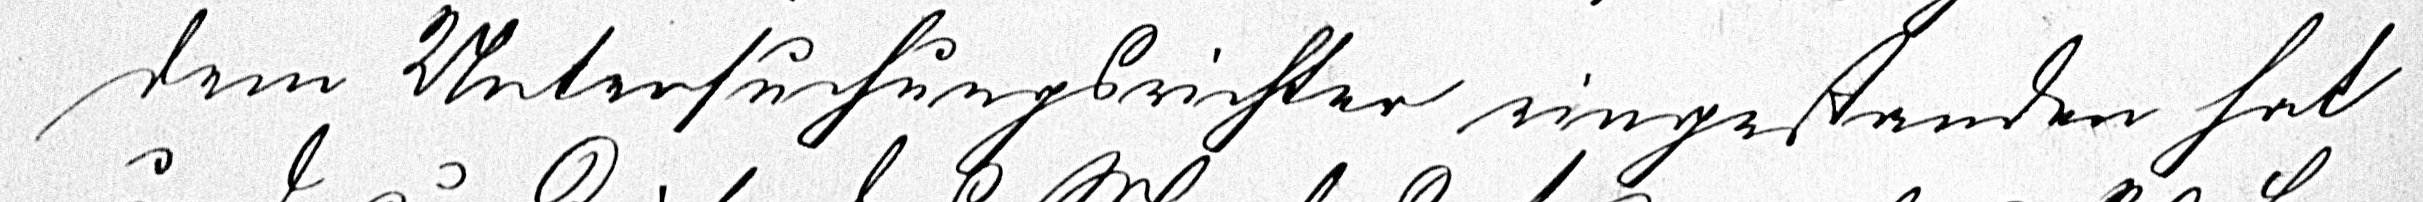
dem Untersuchungsrichter eingestanden hat
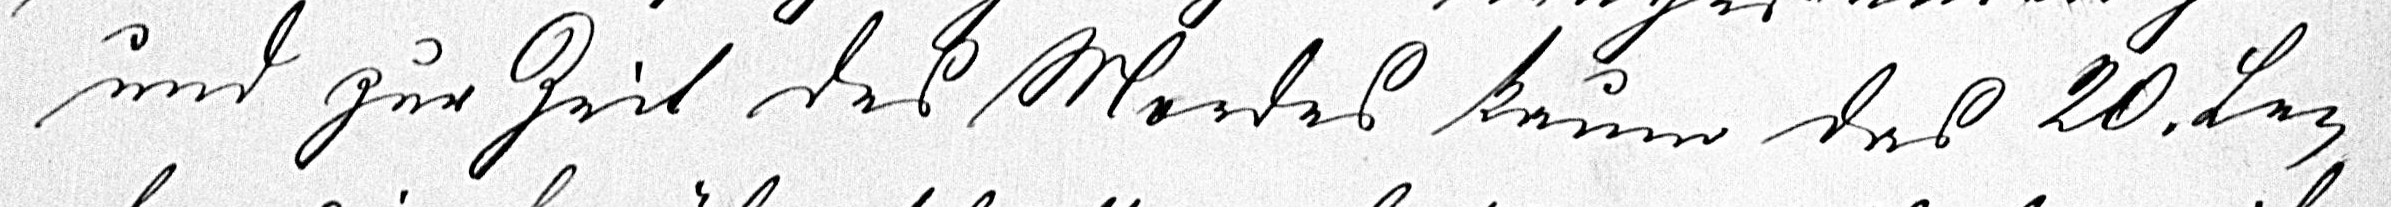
und zur Zeit des Mordes kaum das 20. Le¬
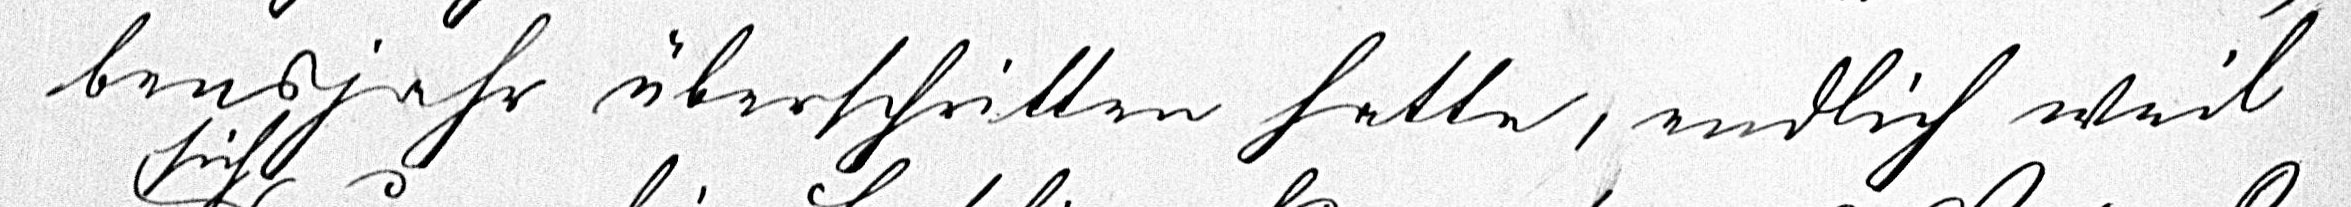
bensjahr überschritten hatte, endlich weil
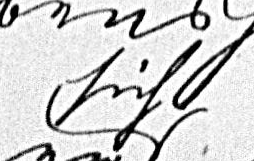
sich
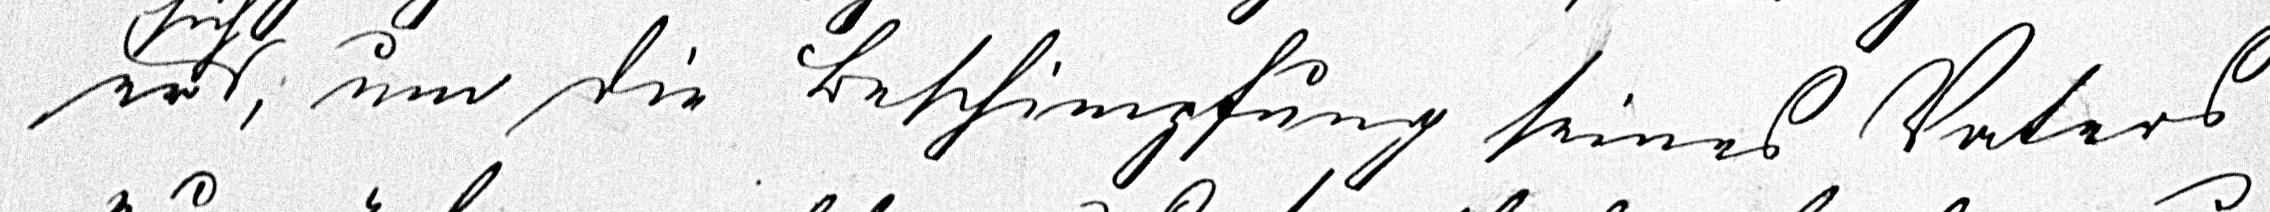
er, und die Beschimpfung seines Vaters
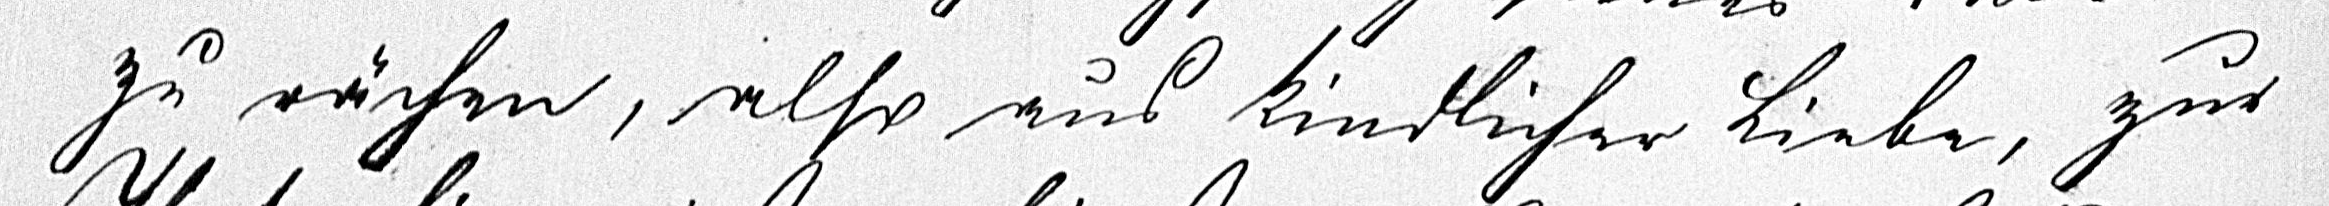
zu rächen, als aus kindlicher Liebe, zur
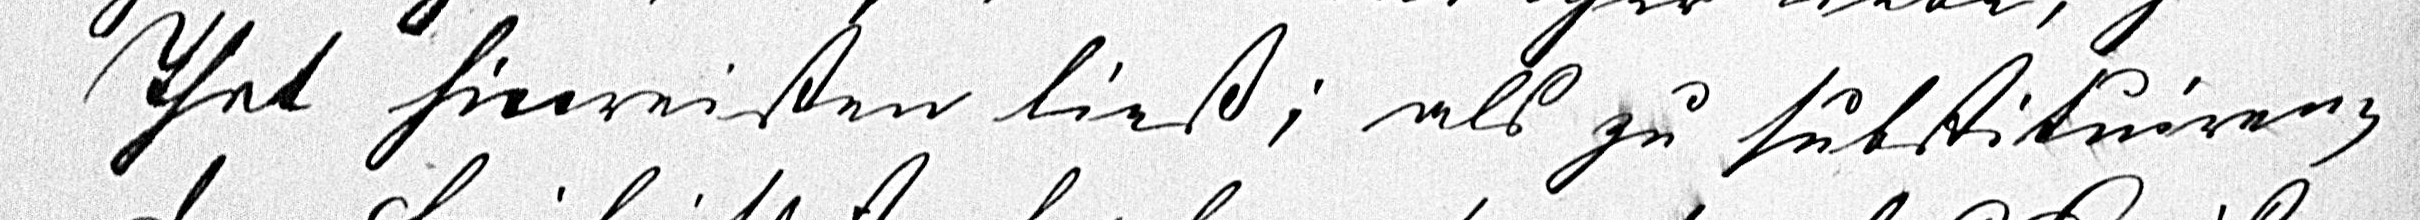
That hinreisten ließ; als zu substituiren¬
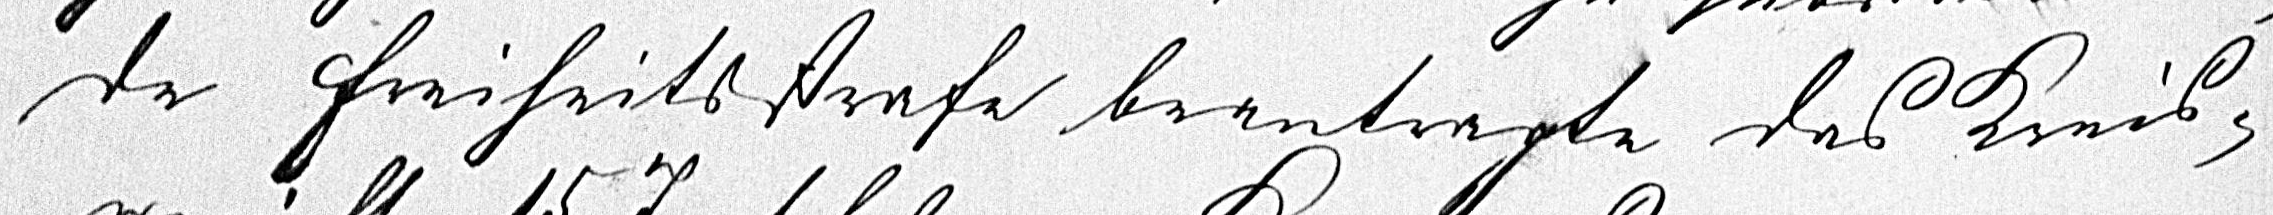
de Freiheitsstrafe beantragte das Kreis¬
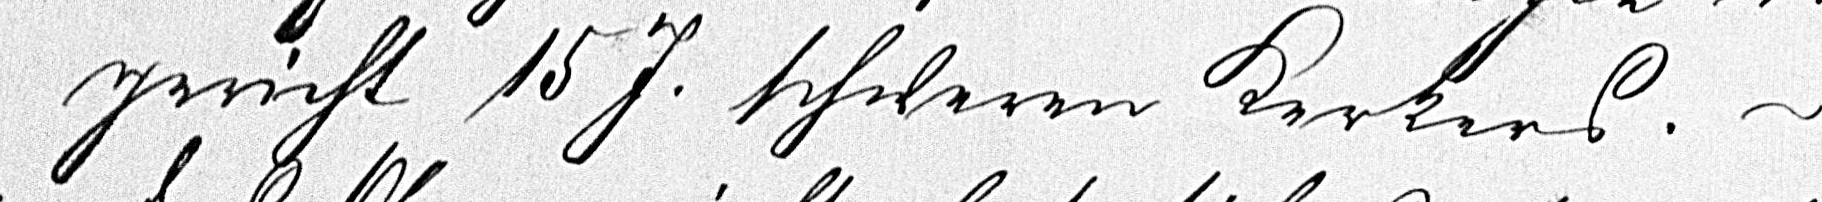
gericht 15 J. schweren Kerkers.
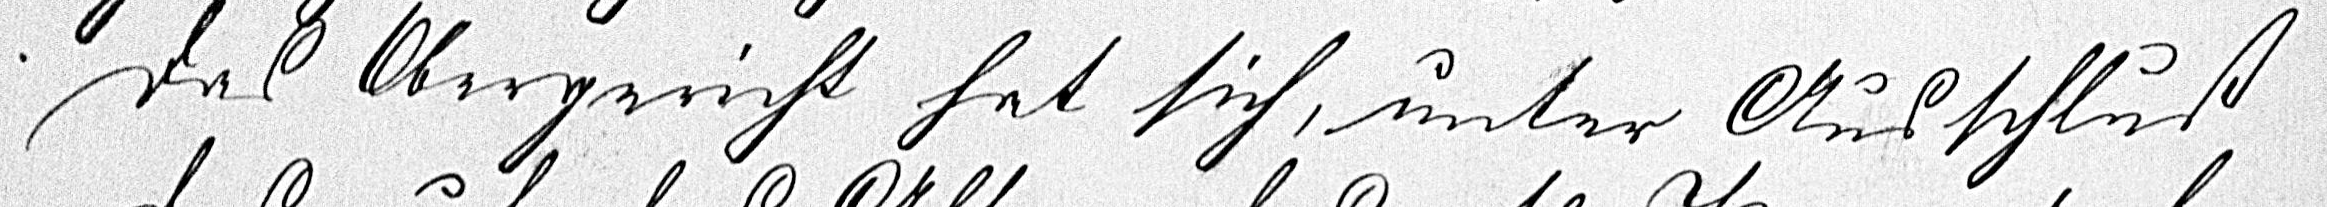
Das Obergericht hat sich, unter Ausschluß
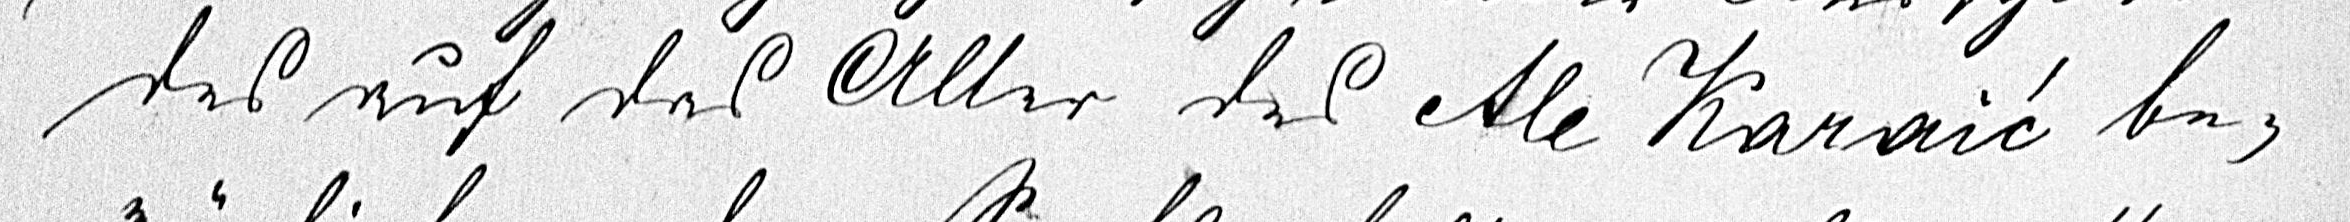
das auf das Alter des Ale Karaić be¬
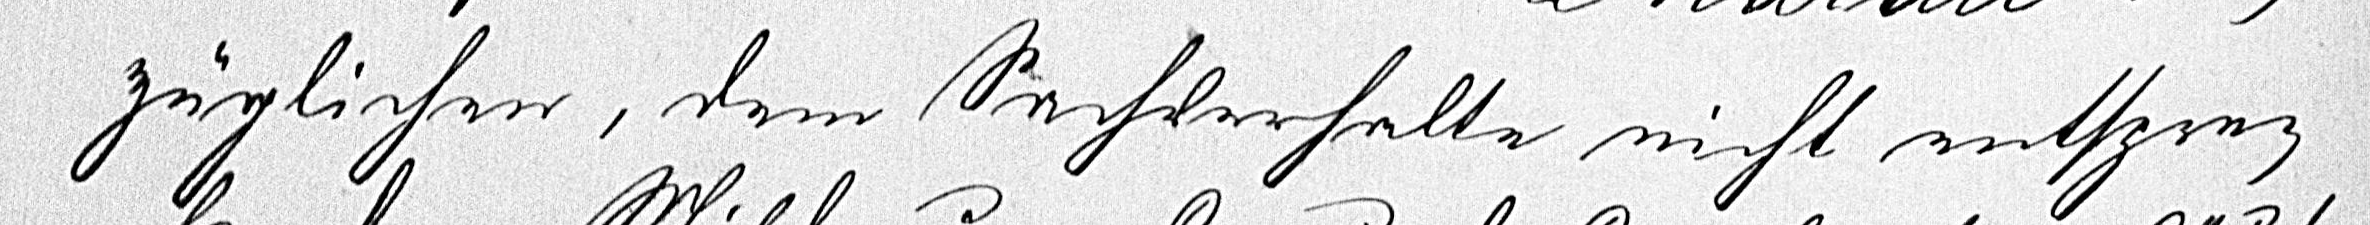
züglichen, dem Sachverhalte nicht entspre¬
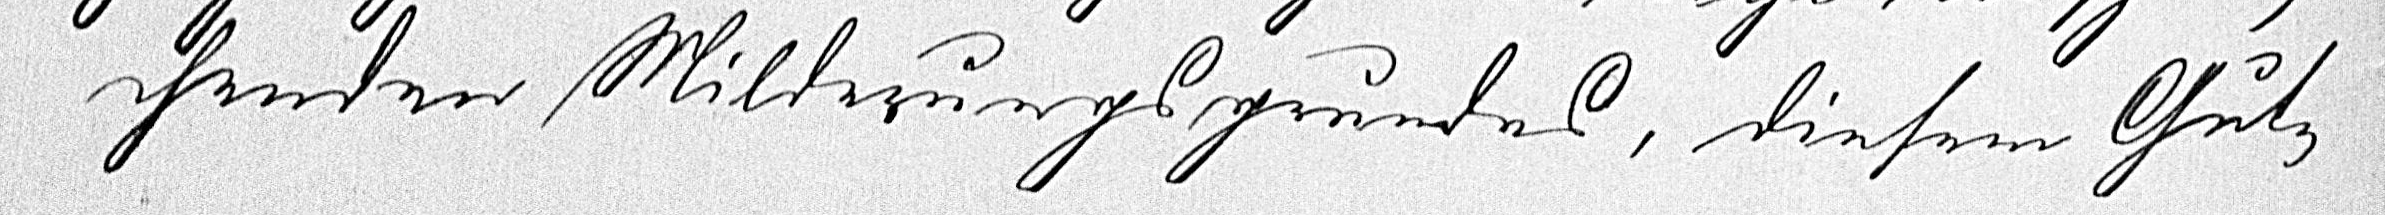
chenden Milderungsgrundes, diesem Gut¬
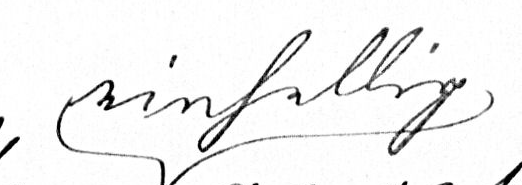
einhellig
